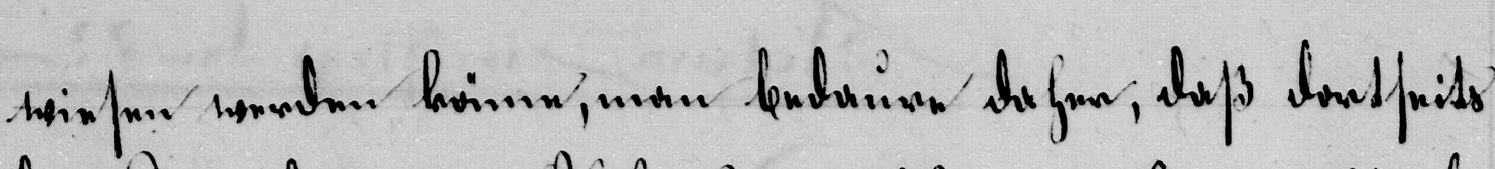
wiesen werden könne, man bedaure daher daß dortseits
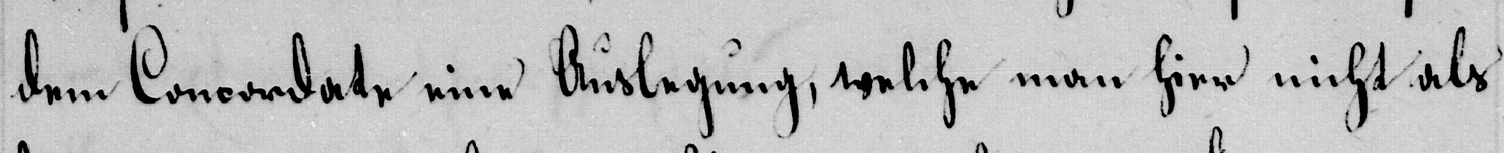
dem Concordate eine Auslegung, welche man hier nicht als
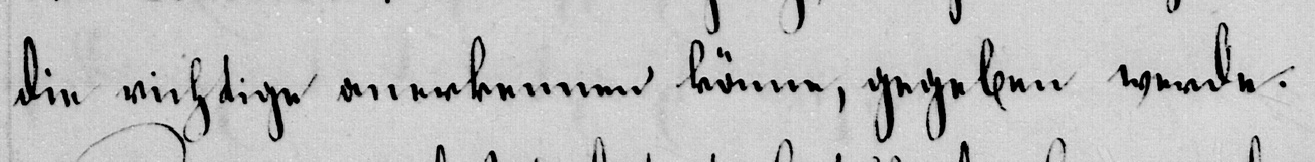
die richtige anerkennen könne, gegeben werde.
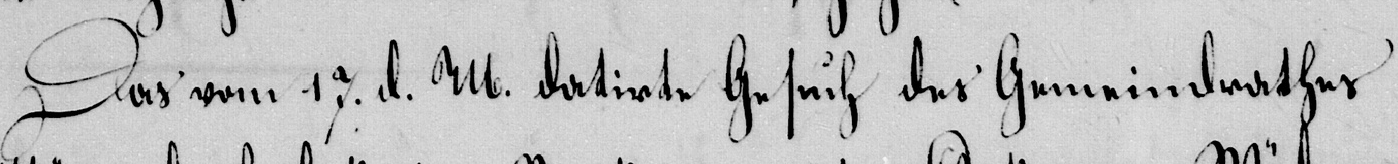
Das vom 17. d. M. datirte Gesuch des Gemeindrathes
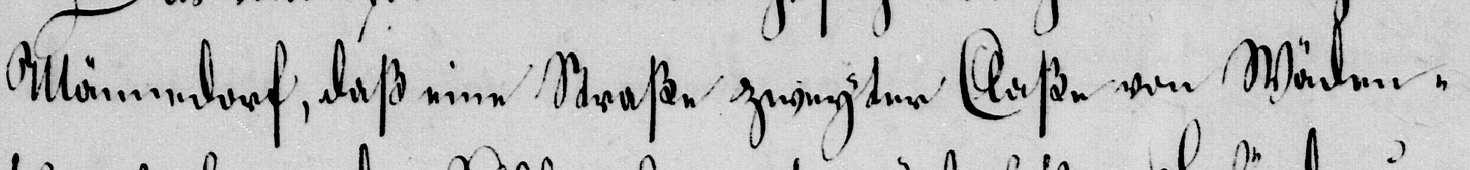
Männedorf, daß eine Straße zweyter Claße von Wäden¬
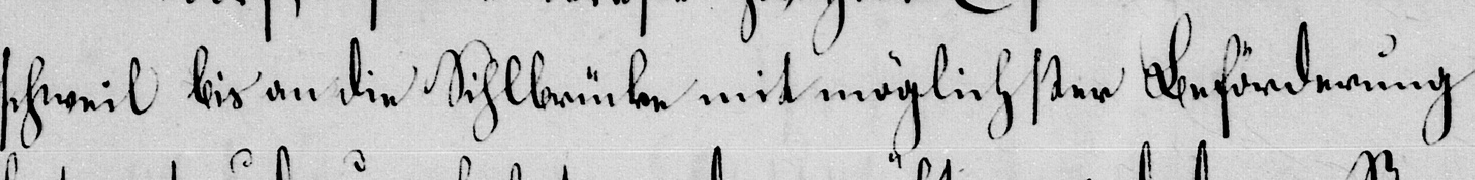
schweil bis an die Sihlbrücke mit möglichster Beförderung
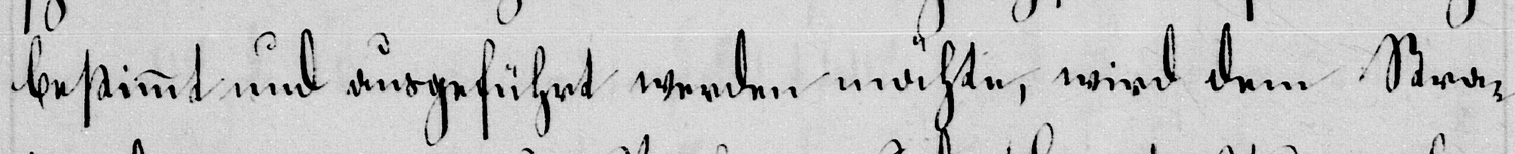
bestimmt und ausgeführt werden möchte, wird dem Stra¬
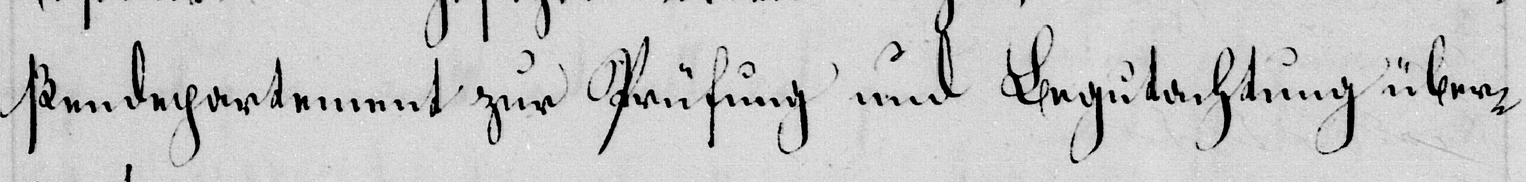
ßendepartement zur Prüfung und Begutachtung über¬
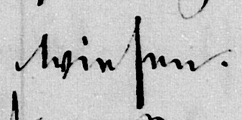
wiesen.
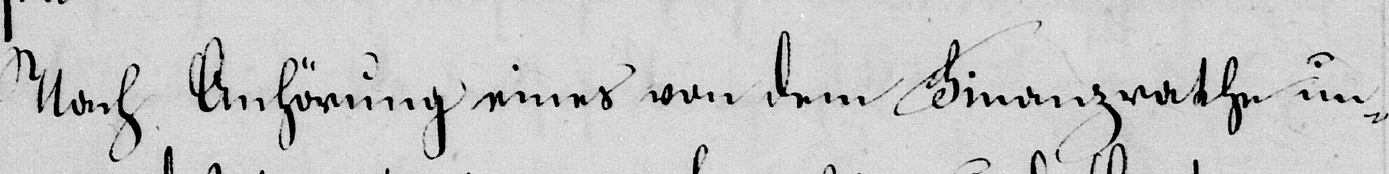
Nach Anhörung eines von dem Finanzrathe unt¬
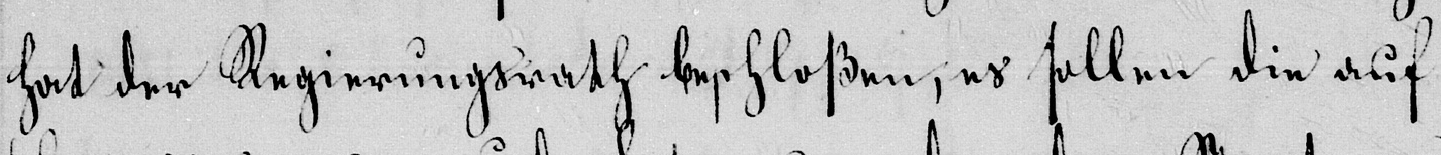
hat der Regierungsrath beschloßen, es sollen die auf
